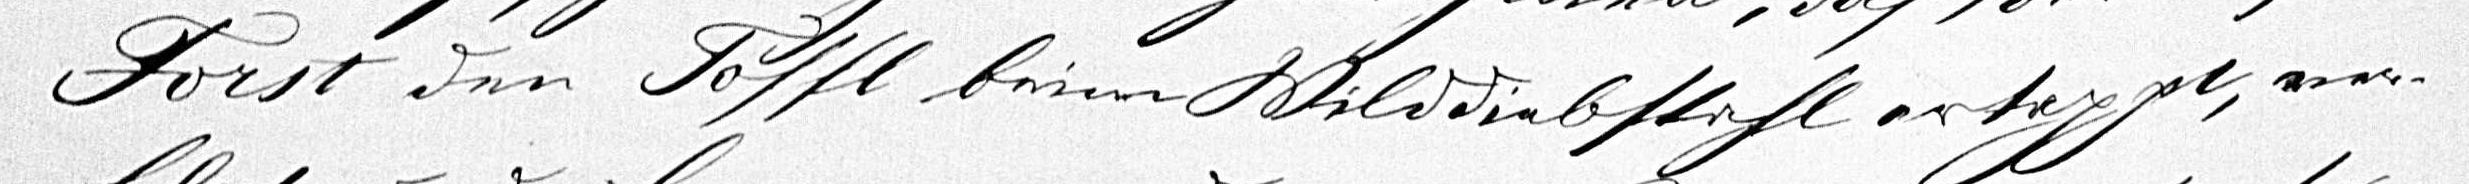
Forst den Toffl beim Wilddiebstahl ertappt, ver¬
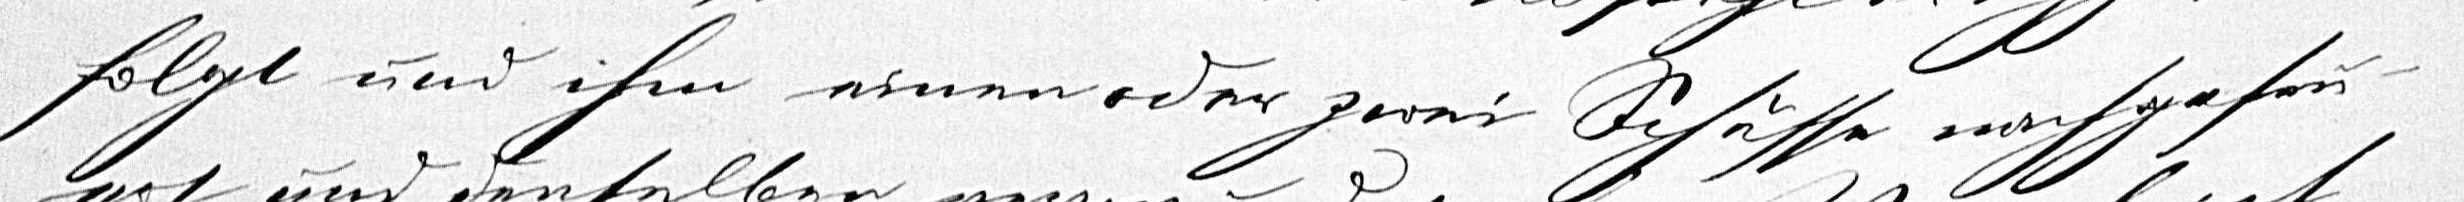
folgt und ihm einen oder zwei Schüsse nachgefeu¬
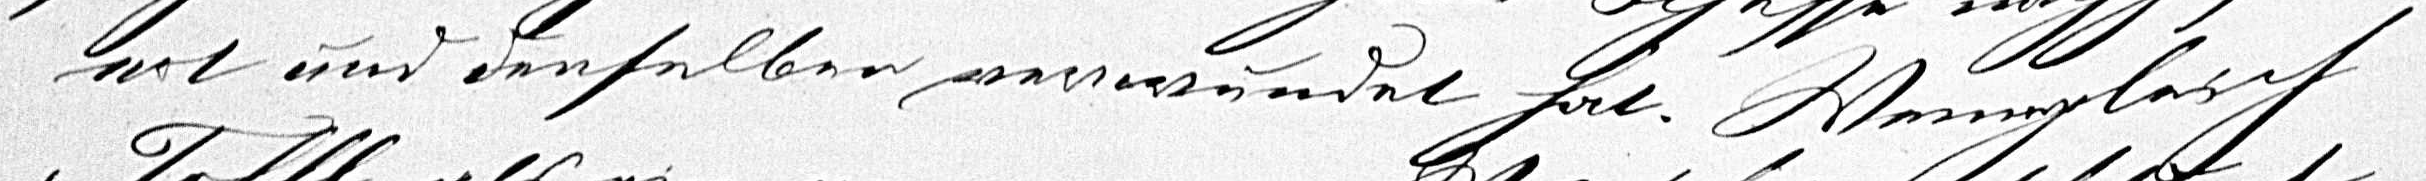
ert und denselben verwundet hat. Wenngleich
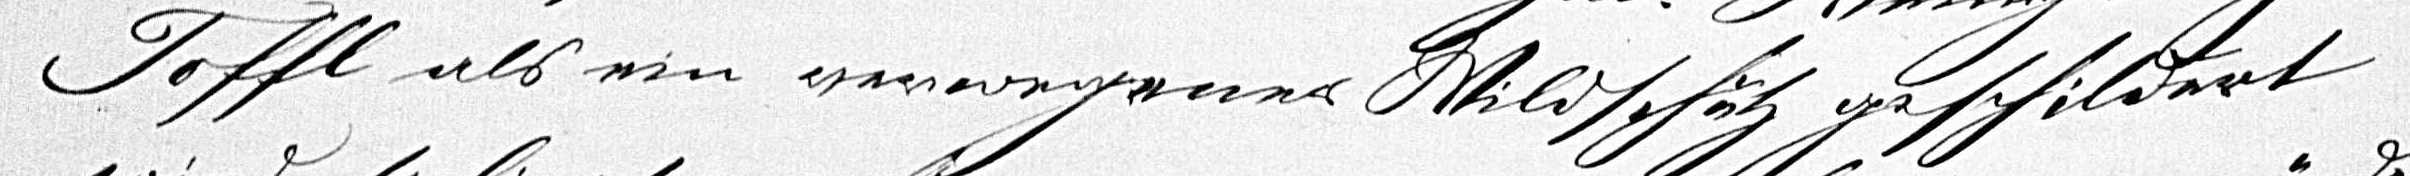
Toffl als ein verwegenes Wildschütz geschildert
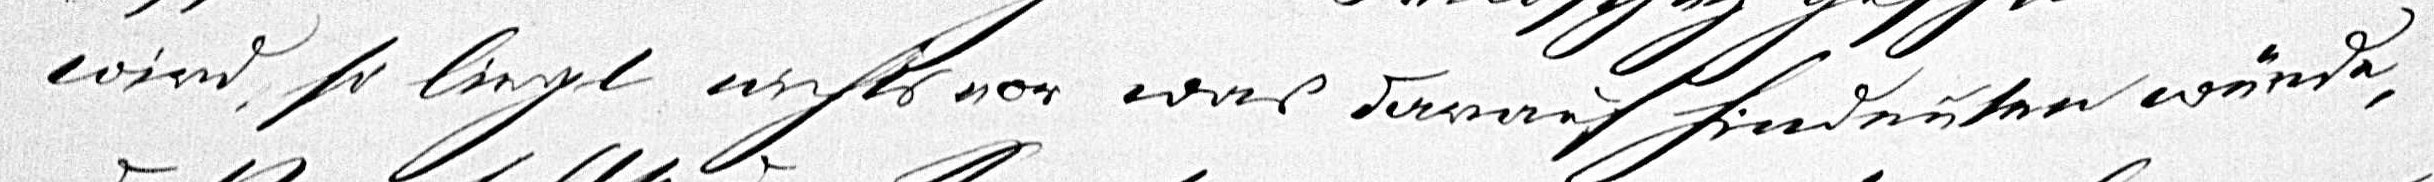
wird, so liegt nichts vor was daran hindeuten würde,
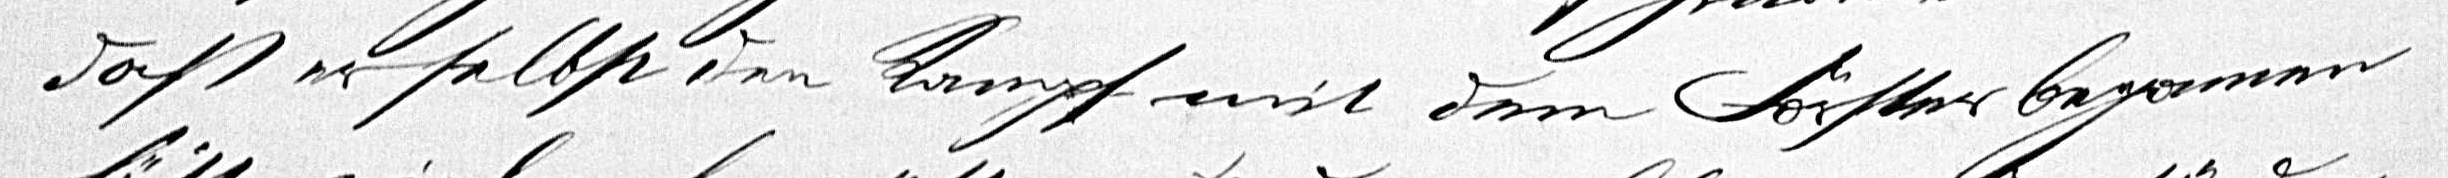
daß er selbst den Kampf mit dem Förster begonnen
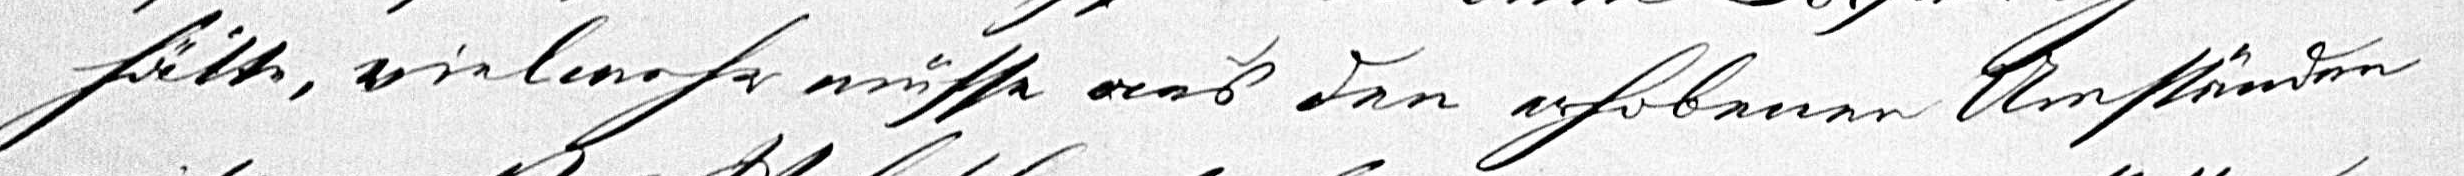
hätte, vielmehr müsse aus den erhobenen Umständen
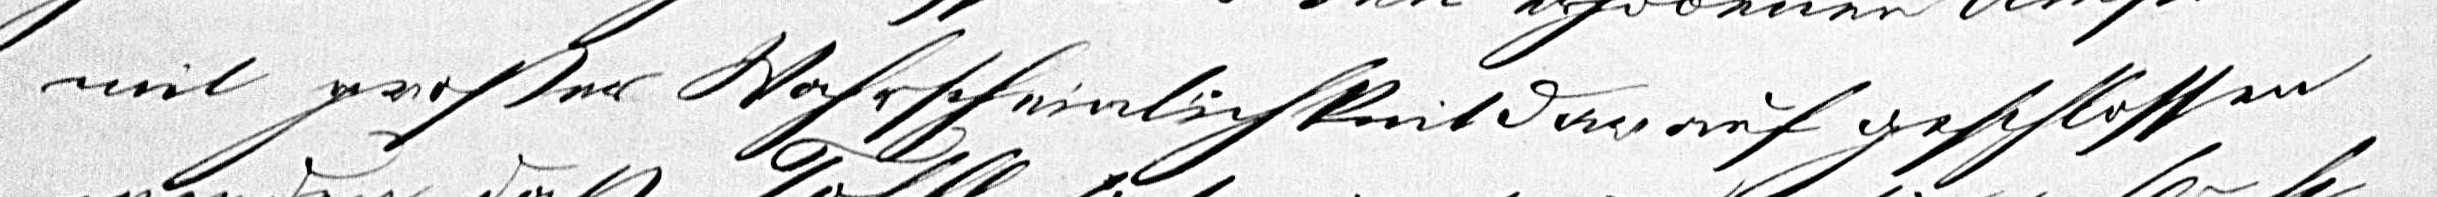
mit großer Wahrscheinlichkeit darauf geschlossen
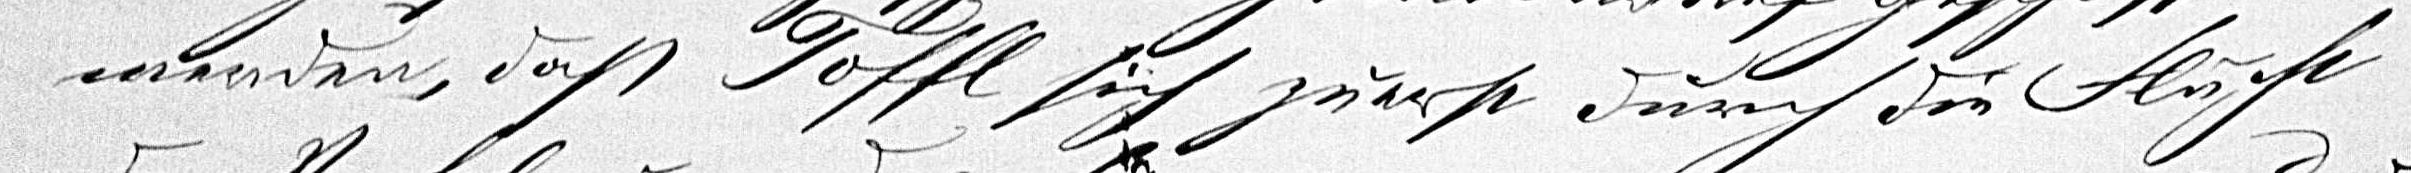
werden, daß Toffl sich zuerst durch die Flucht
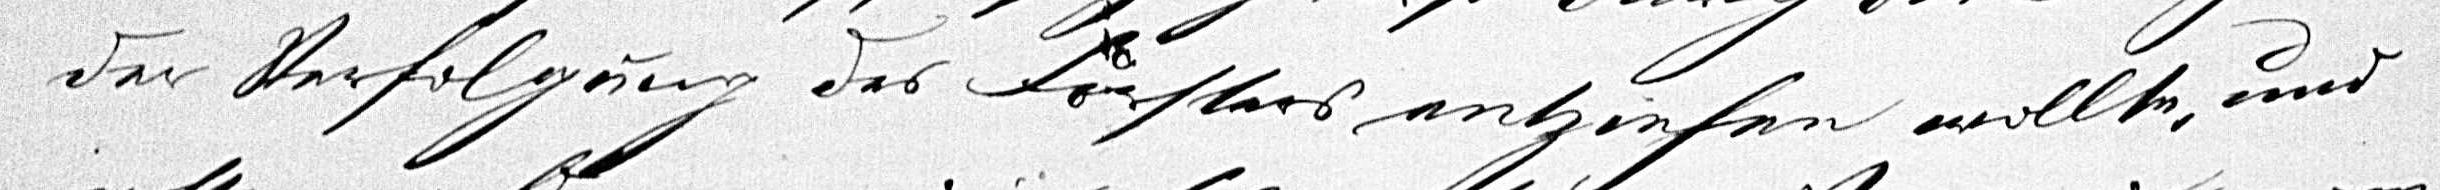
der Verfolgung des Forsters entziehen wollte, und
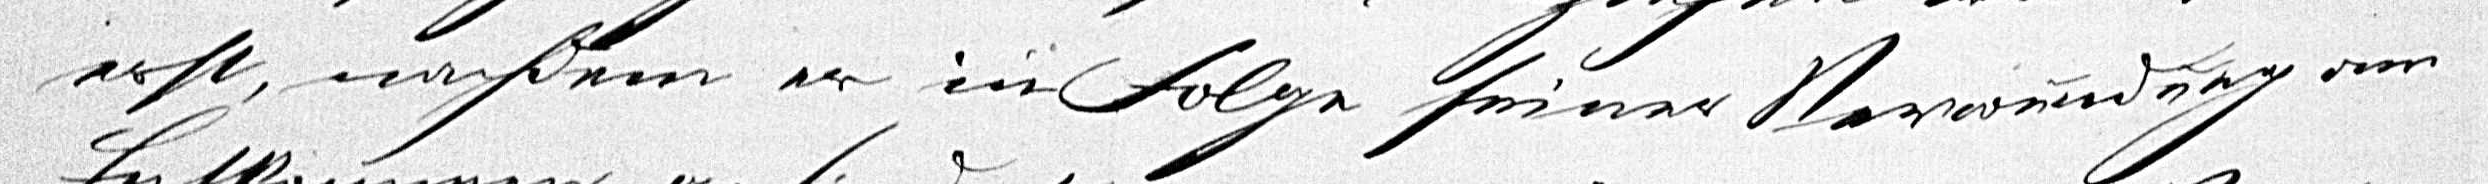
erst, nachdem er in Folge seiner Verwundung am
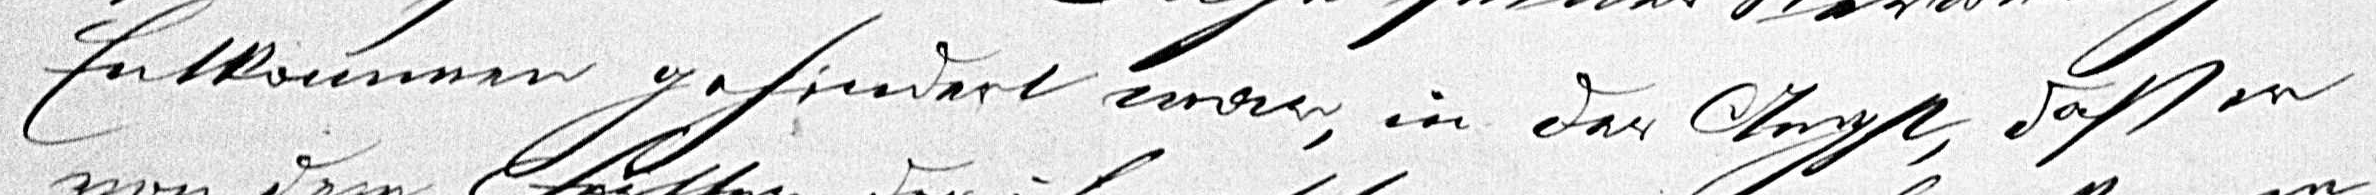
Entkommen gehindert war, in der Angst, daß er
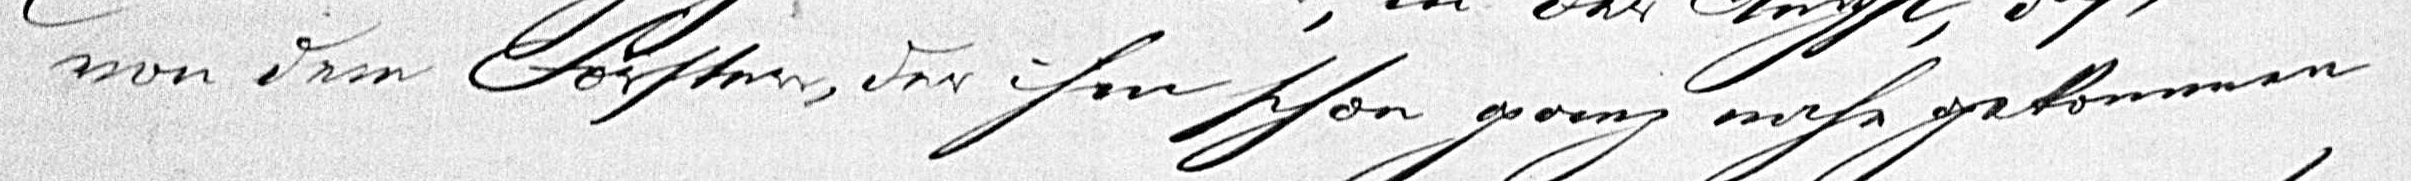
von dem Forsten, der ihm schon ganz nahe gekommen
